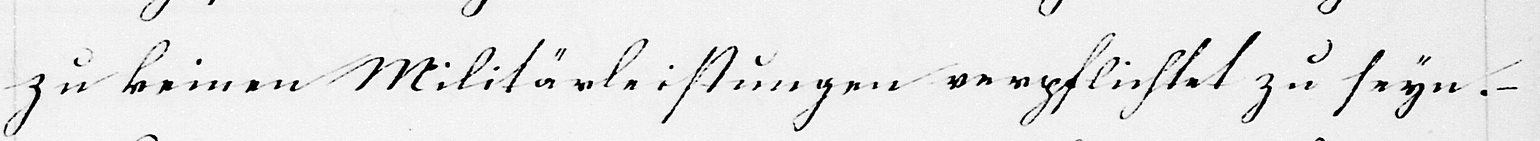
zu keinen Militärleistungen verpflichtet zu seyn.
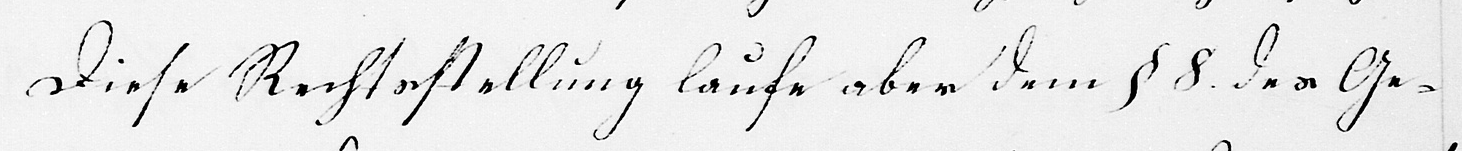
Diese Rechtsstellung laufe aber dem § 8. des Ge¬
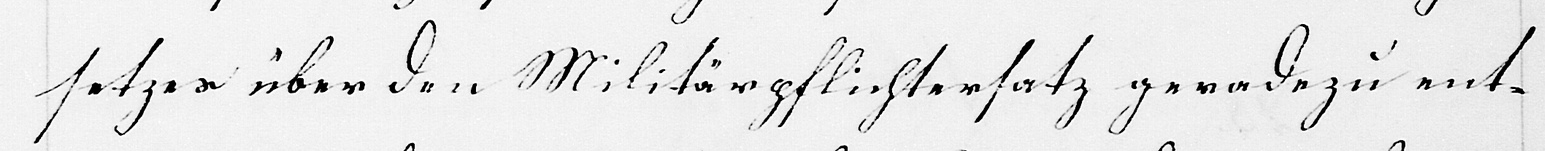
setzes über den Militärpflichtersatz geradezu ent¬
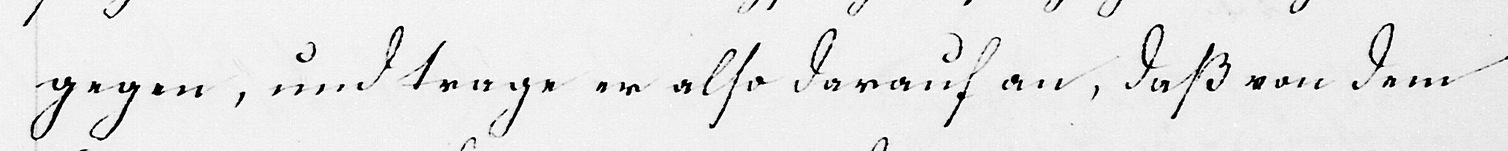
gegen, und trage er also darauf an, daß von dem
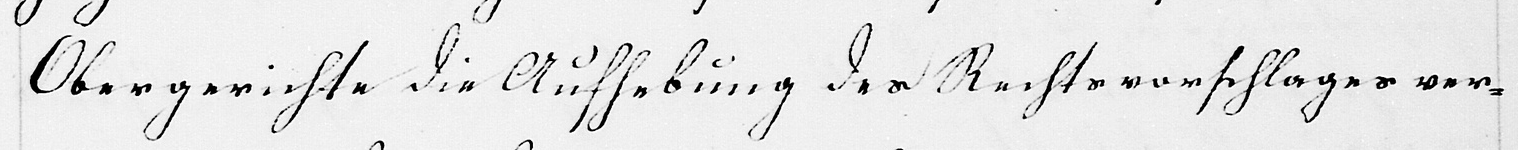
Obergerichte die Aufhebung des Rechtsvorschlages ver¬
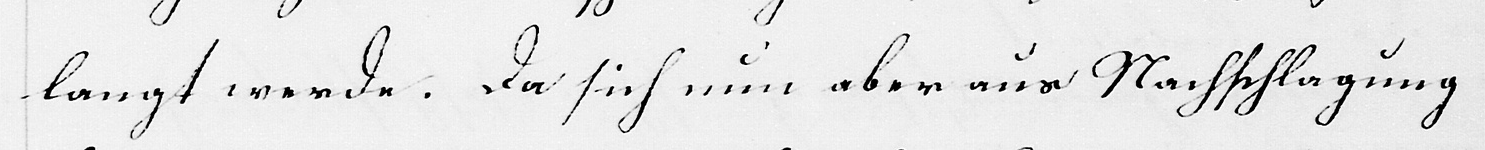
langt werde. Da sich nun aber aus Nachschlagung
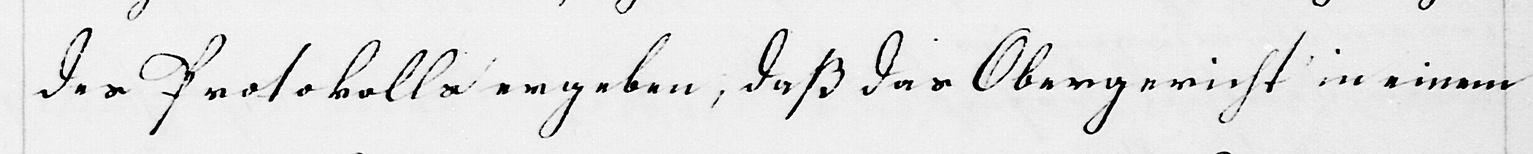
des Protokolls ergeben, daß das Obergericht in einem
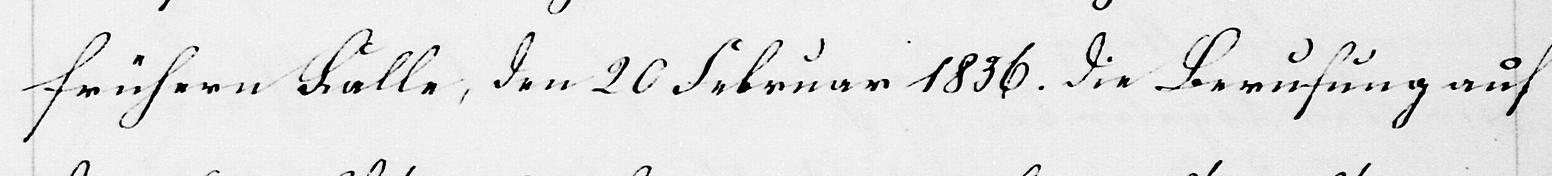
frühern Falle, den 20 Februar 1836. die Berufung auf
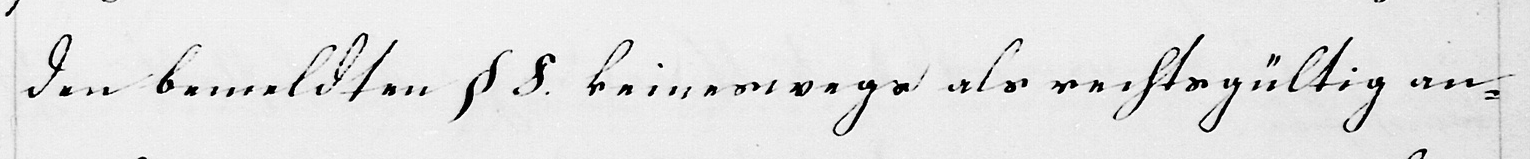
den bemeldten § 8. keineswegs als rechtsgültig an¬
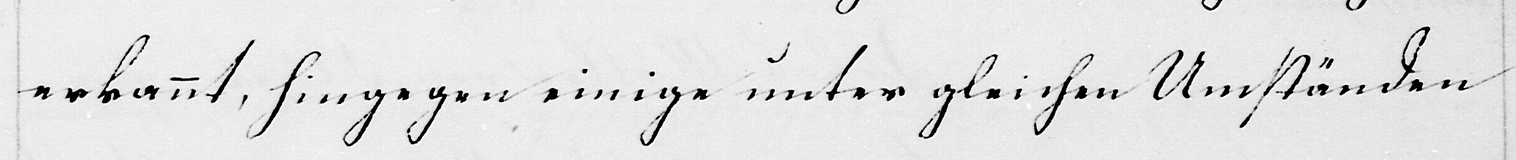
erkannt, hingegen einige unter gleichen Umständen
